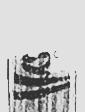楚
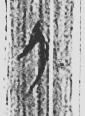人
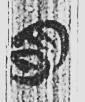明
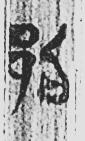{勺阝}
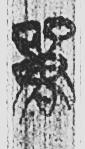{單口}
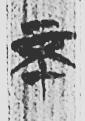不
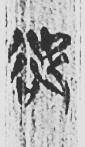欲
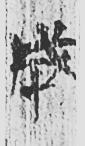成
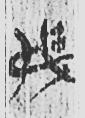弗
